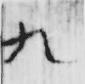九
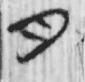月
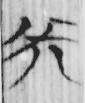癸
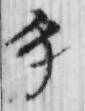丑
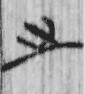之
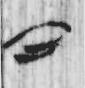日
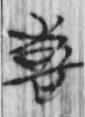喜
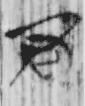君
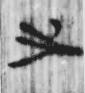之
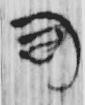司
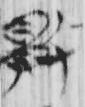敗
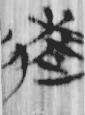遠
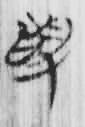受
